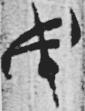民
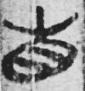眚（性）
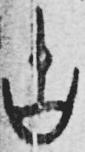古（固）
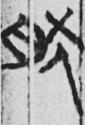肰（然）
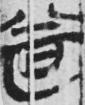甚
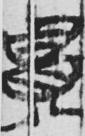貴
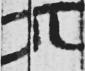亓（其）
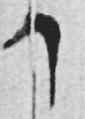人
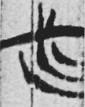必
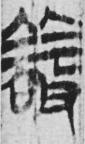敬
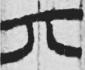亓（其）
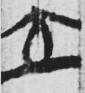立（位）
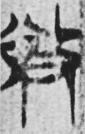敓（悅）
